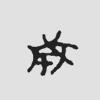成
